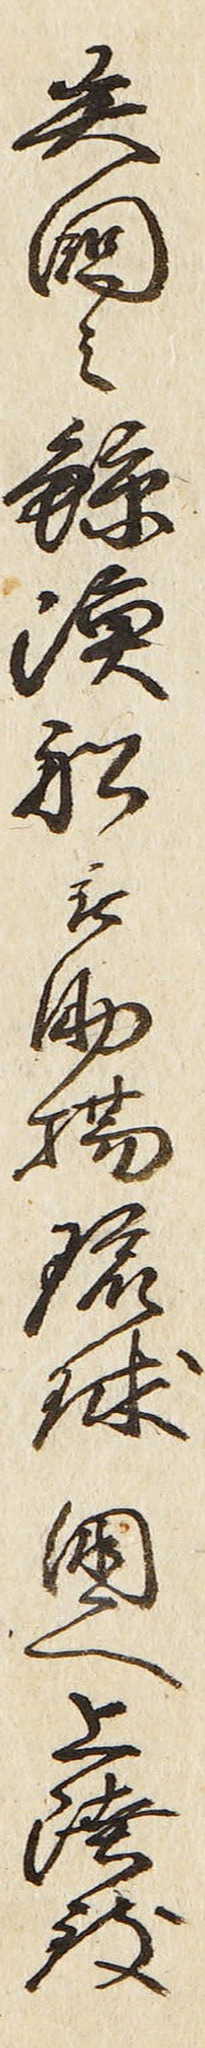異国之鯨漁船被助揚琉球国へ上陸致
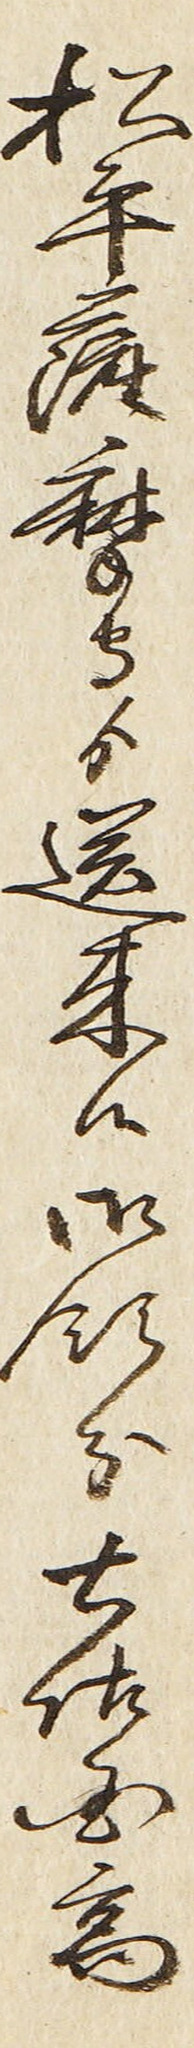松平薩摩守ゟ送来候御領分土佐国高
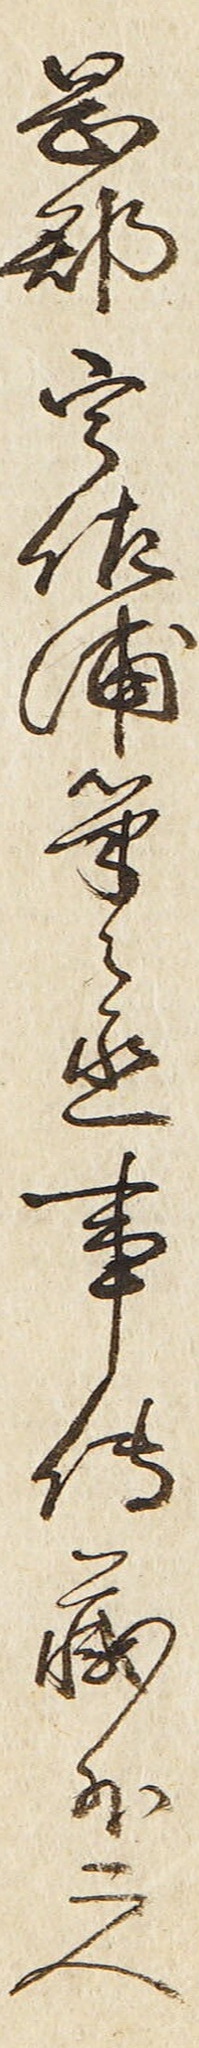岡郡宇佐浦筆之丞事伝蔵外二人
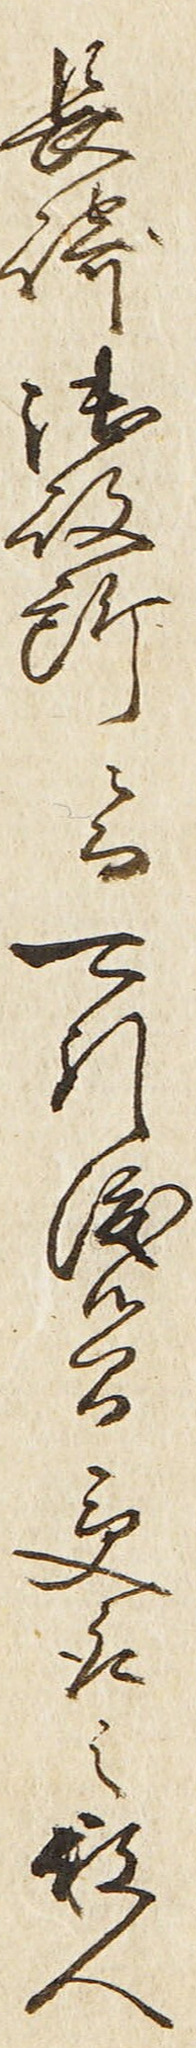長崎御役所に而可引渡候間受取之役人
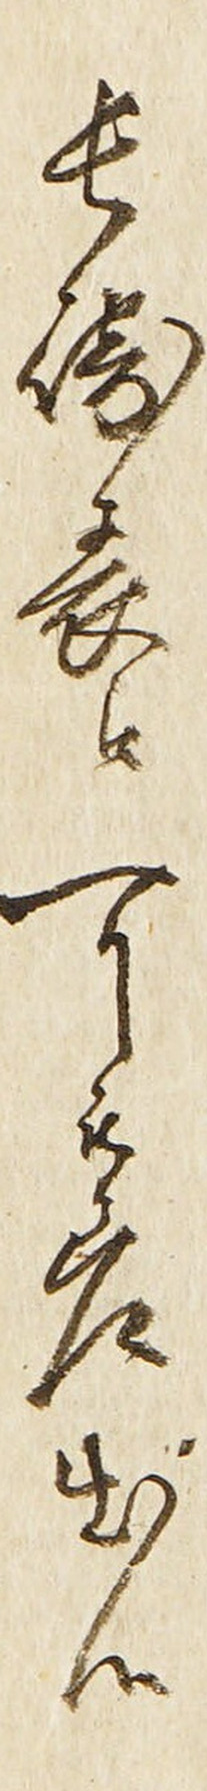長崎表え可被差出候
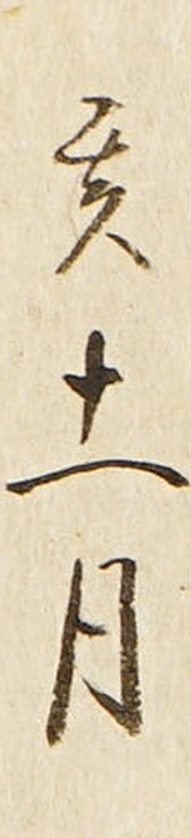亥十一月
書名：土佐中浜万次郎漂流記
